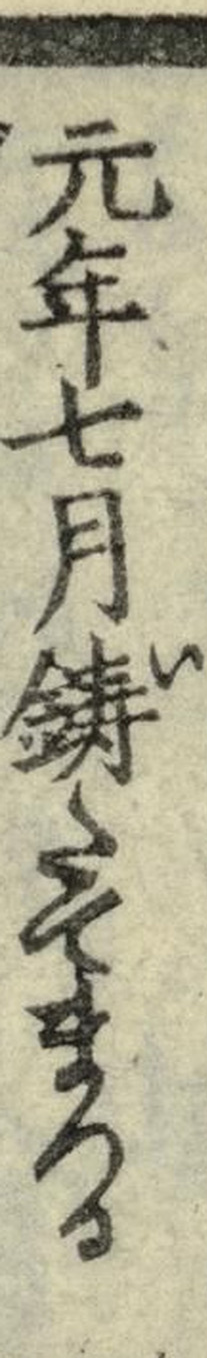元年七月鋳たてまつる
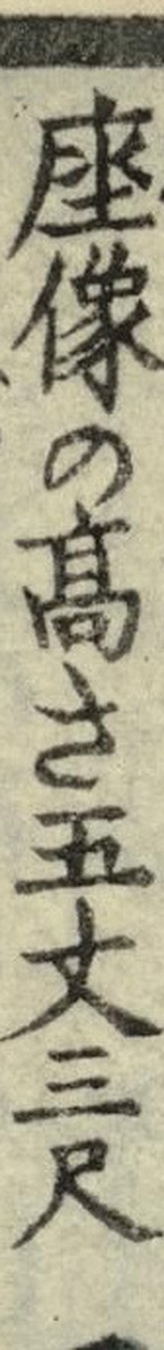座像の高さ五丈三尺
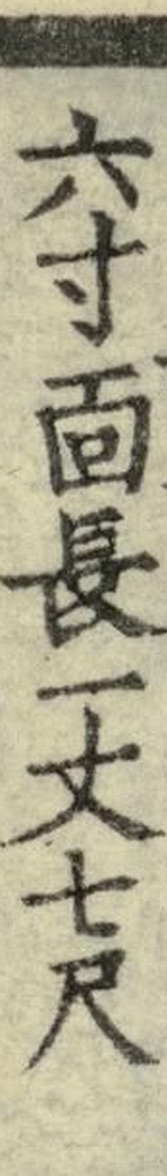六寸面長一丈七尺
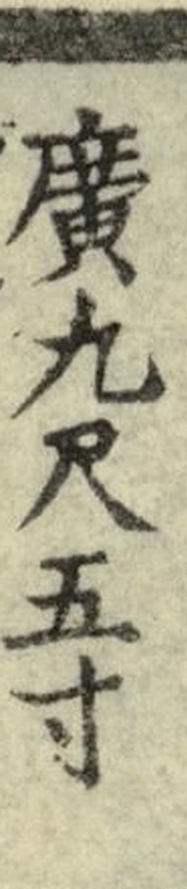広九尺五寸
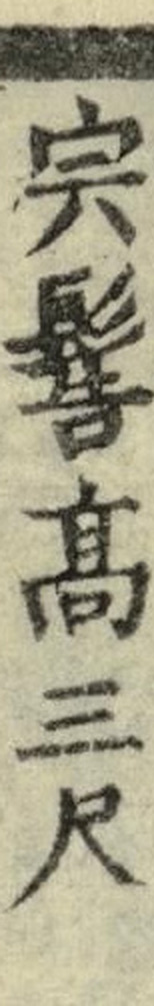宍髻高三尺

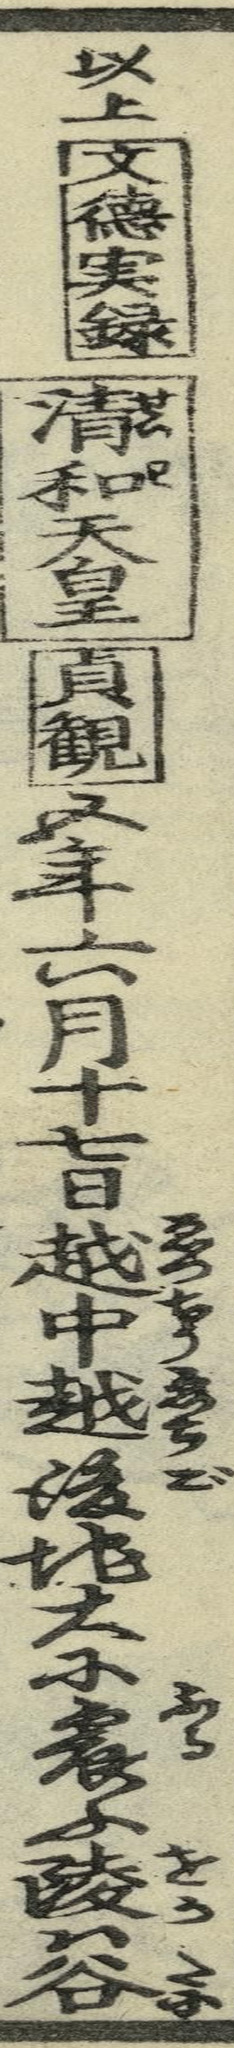以上文徳実録清和天皇貞観五年六月十七日越中越後地大に震ふ陵は谷
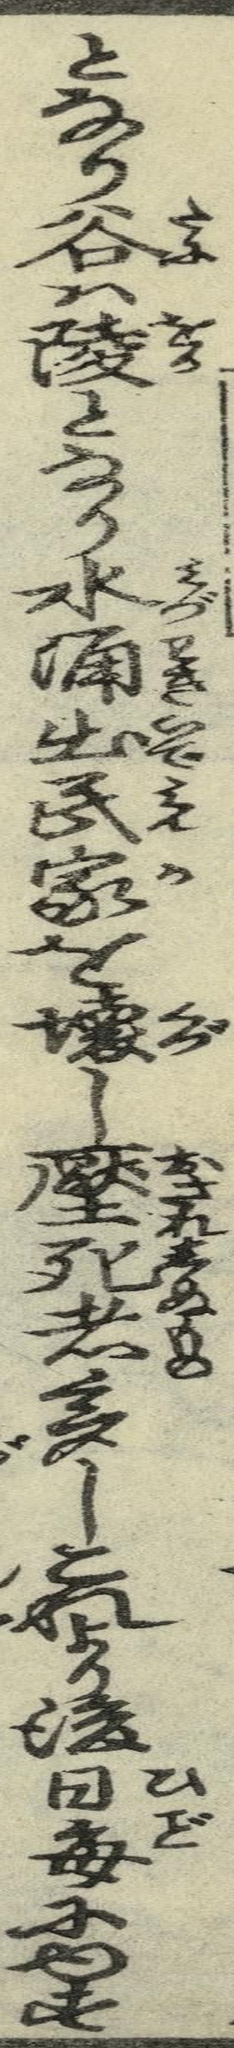となり谷は陵となり水涌出民家を壊し圧死者多しこれより後日毎にゆす
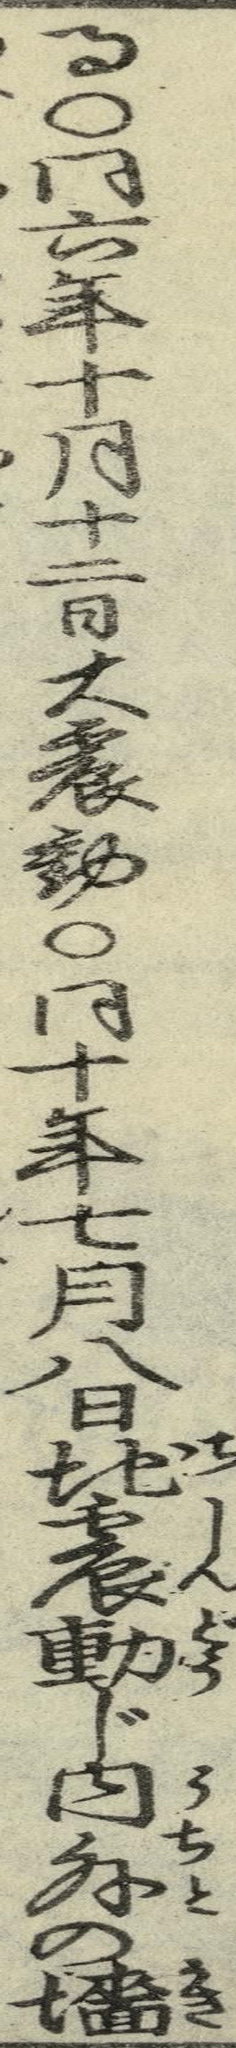る◯同六年十月十二日大震動◯同十年七月八日地震動じ内外の墻
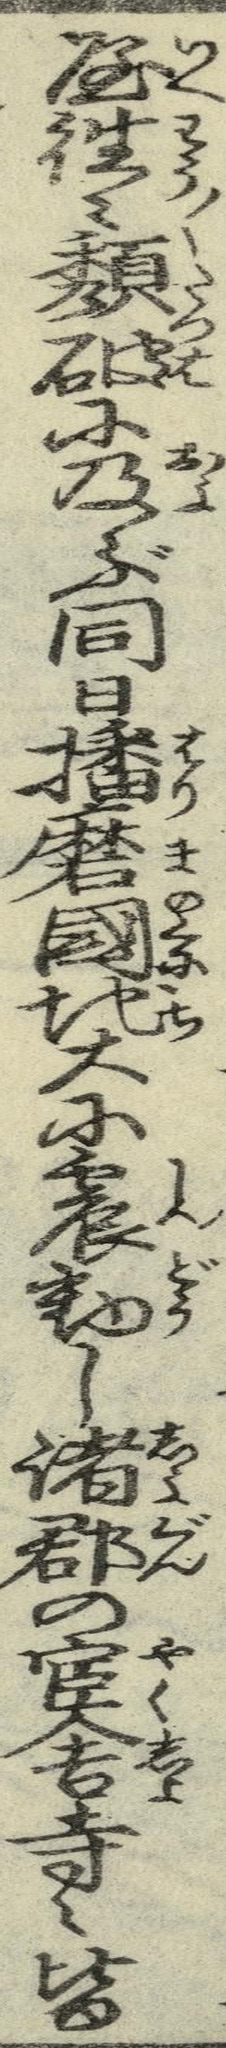屋往々頽破に及ぶ同日播磨国地大に震動し諸郡の宦舎寺々皆
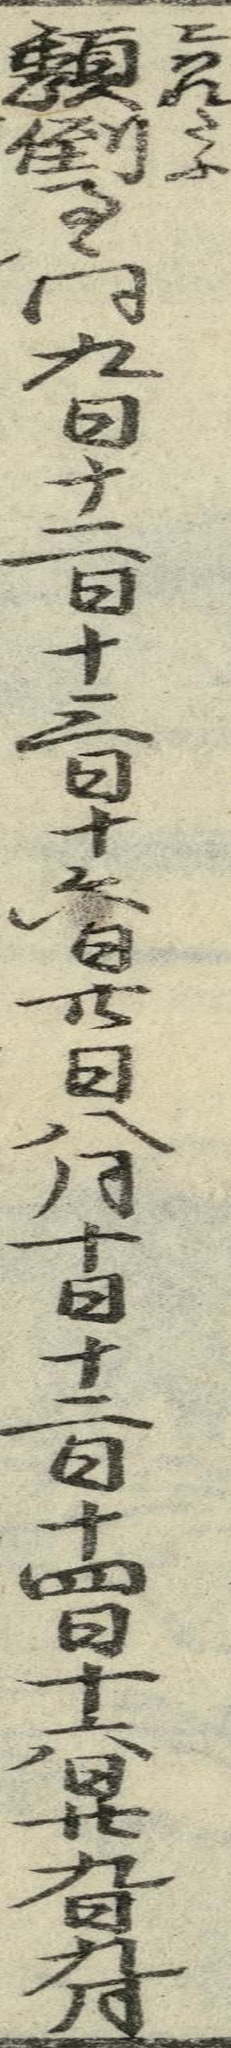頽倒るゝ同九日十二日十三日十六日廿日八月十日十二日十四日十六日廿九日九月
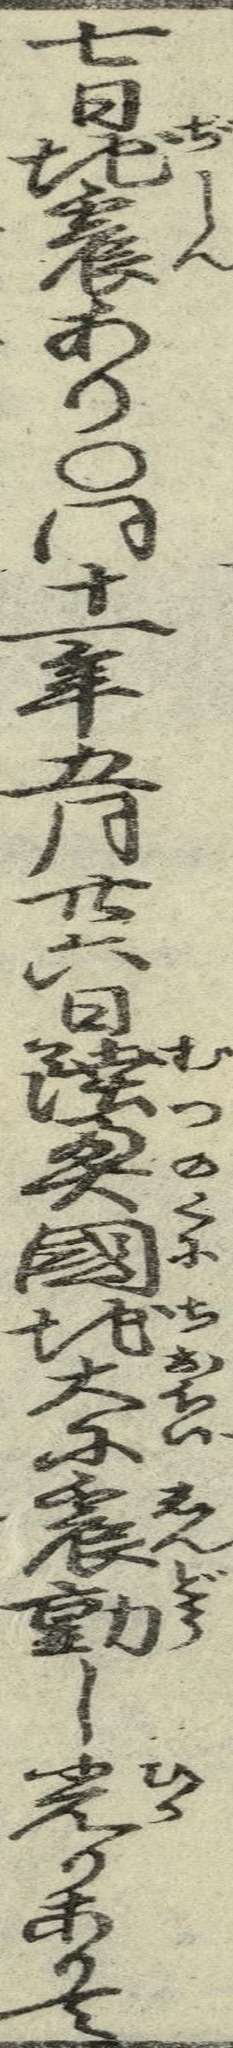七日地震あり◯同十一年五月廿六日陸奥国地大に震動し光りありて
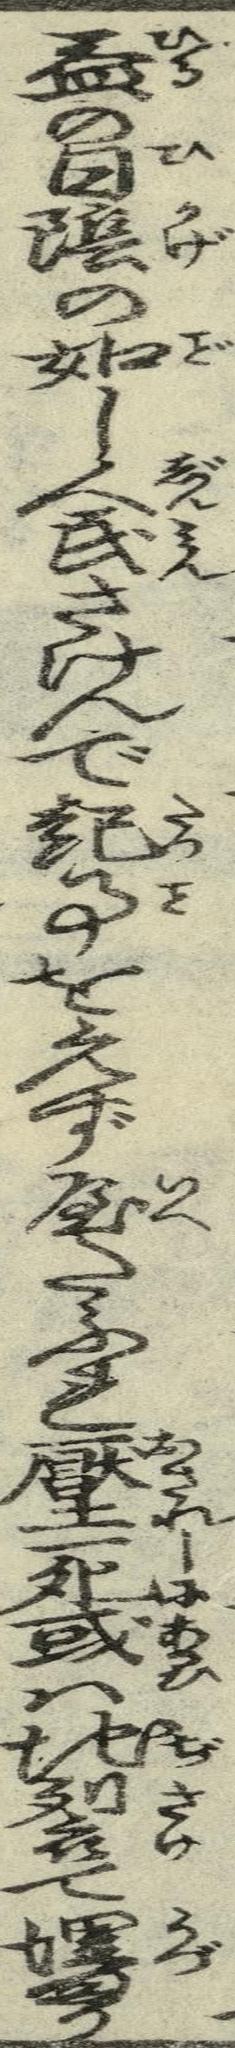昼の日陰の如し人民さけんで起事をえず屋たふれ圧死或は地裂て埋まり
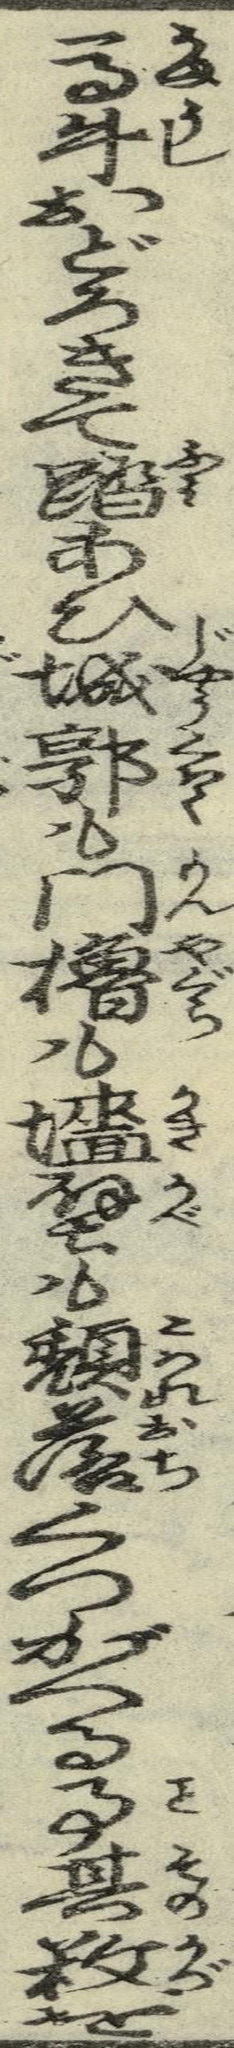馬牛おどろきて踏あひ城郭も門櫓も墻壁も頽落くつがへる事其数を
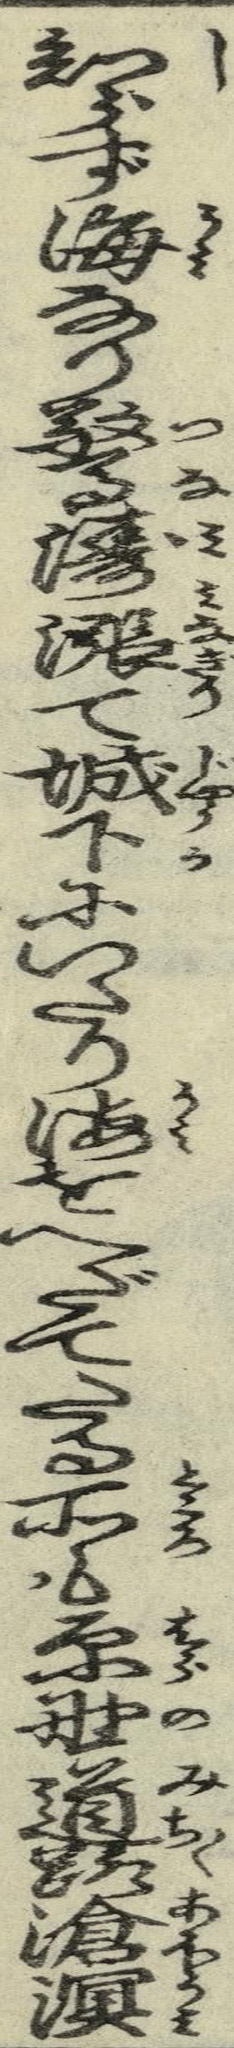知らず海なり驚濤漲て城下にいたり海をへだてたる所も原野道路滄溟
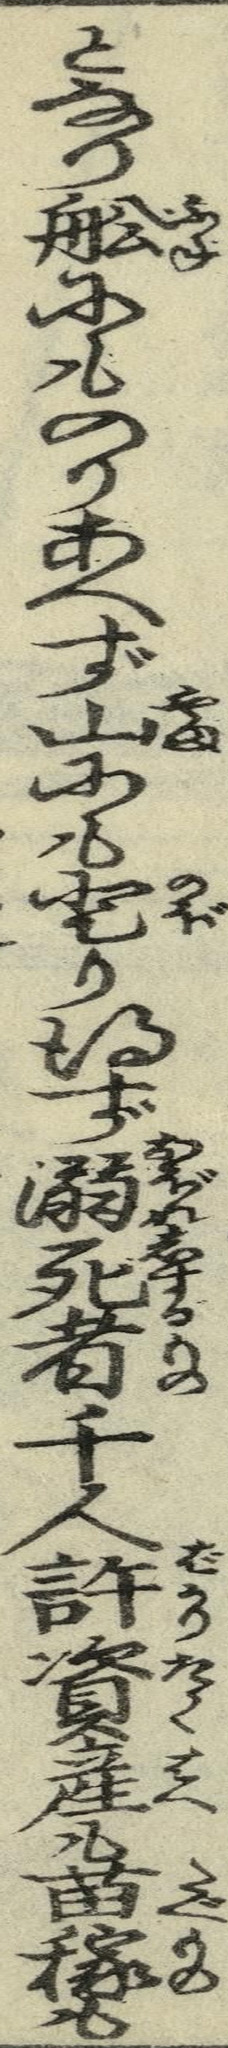となり船にものりあへず山にも登り得ず溺死者千人許資産も苗稼も
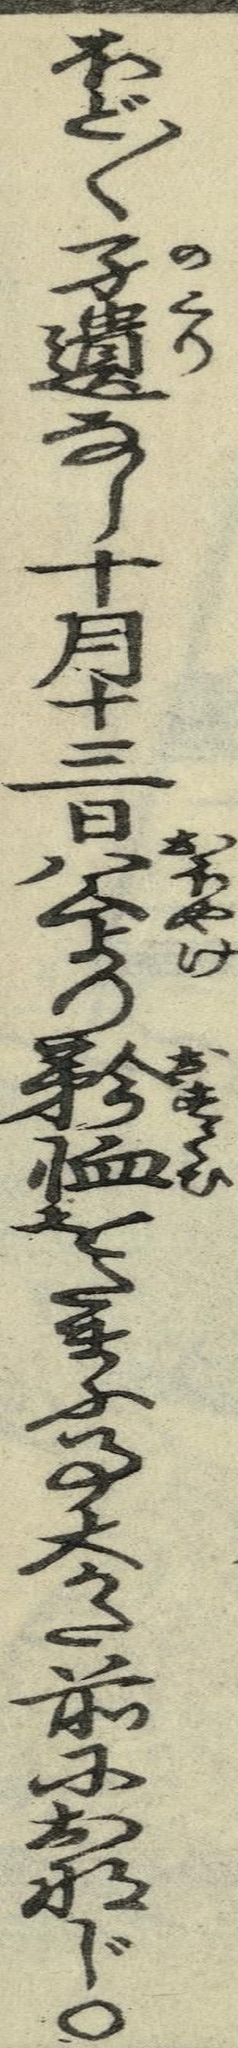ほど〳〵孑遺なし十月十三日公より矜恤をたまふ事大かた前におなじ◯
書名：地震年代記
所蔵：東京大学地震研究所図書室 Earthquake Research Institute Library, The University of Tokyo, JAPAN
